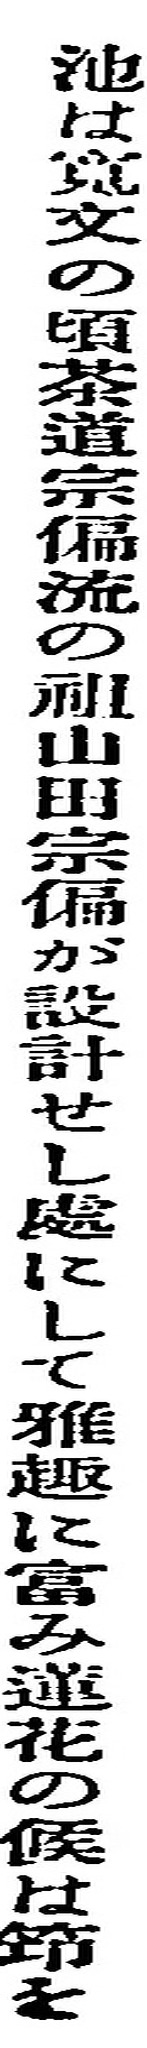池は寛文の頃茶道宗偏流の祖山田宗偏が設計せし處にして雅趣に富み蓮花の候は笻を
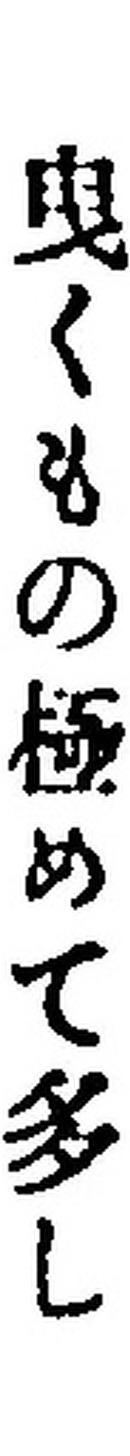曳くもの極めて多し
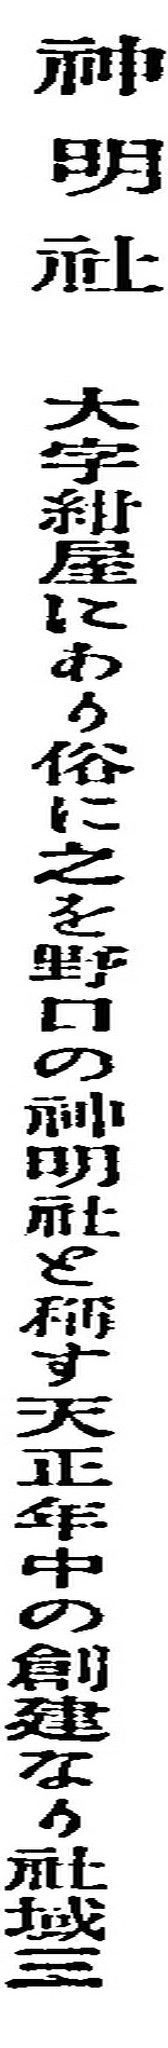神明社大字紺屋にあり俗に之を野口の神明社と稱す天正年中の創建なり社域三
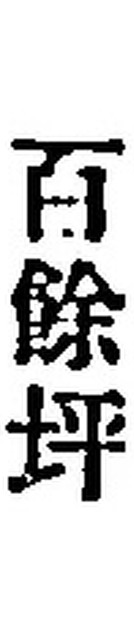百餘坪
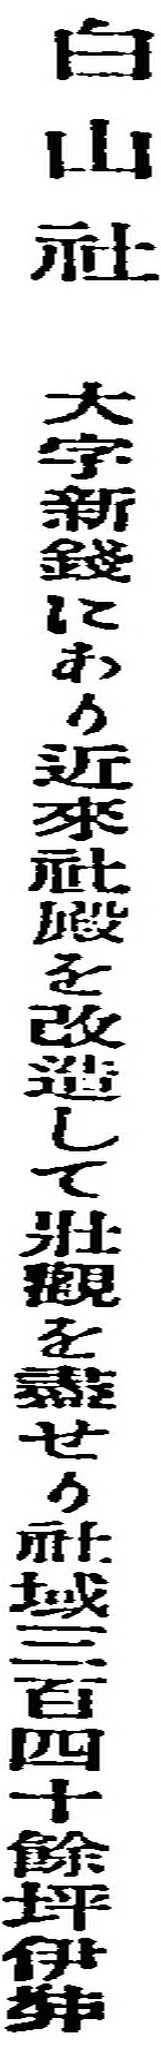白山社大字新錢にあり近來社殿を改造して壯觀を盡せり社域三百四十餘坪伊弉
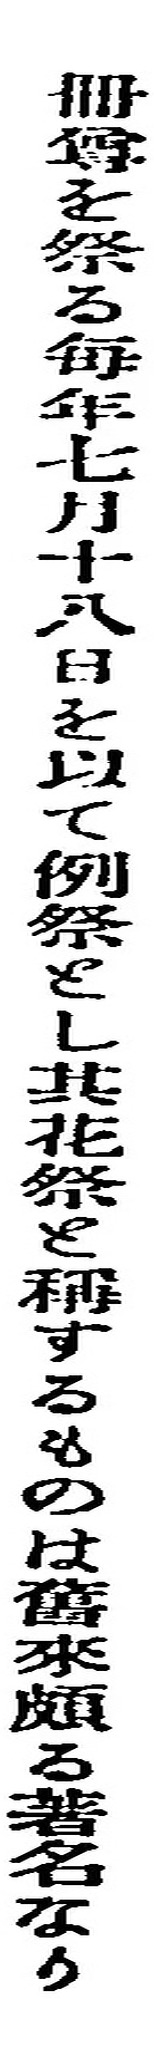冊尊を祭る每年七月十八日を以て例祭とし其花祭と稱するものは舊來頗る著名なり
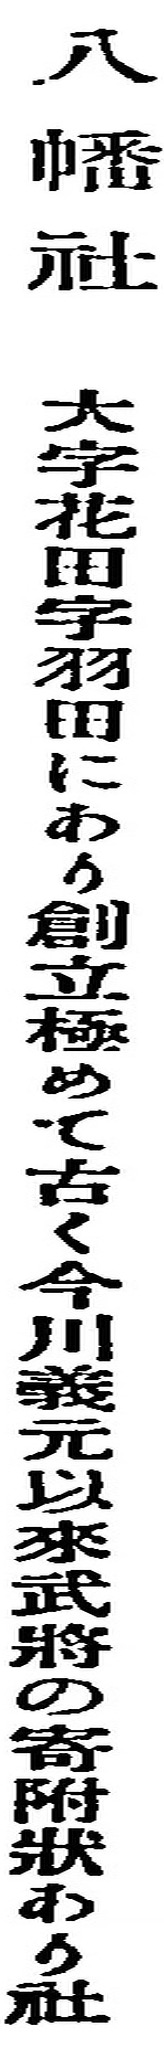八幡社大字花田字羽田にあり創立極めて古く今川義元以來武將の寄附狀あり社
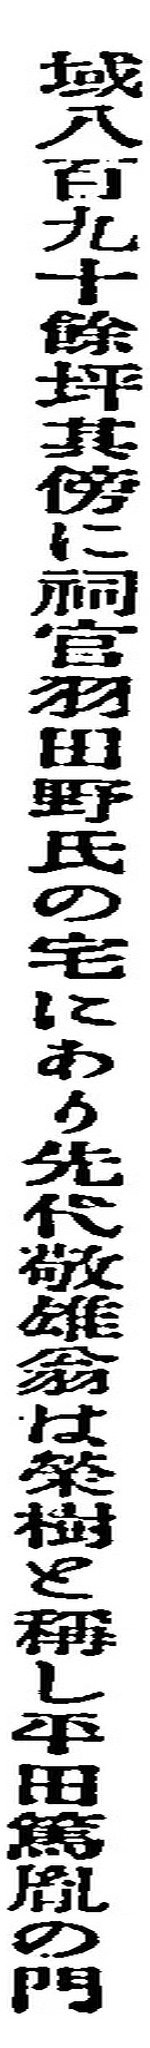域八百九十餘坪其傍に祠官羽田野氏の宅にあり先代敬雄翁は榮樹と稱し平田篤胤の門
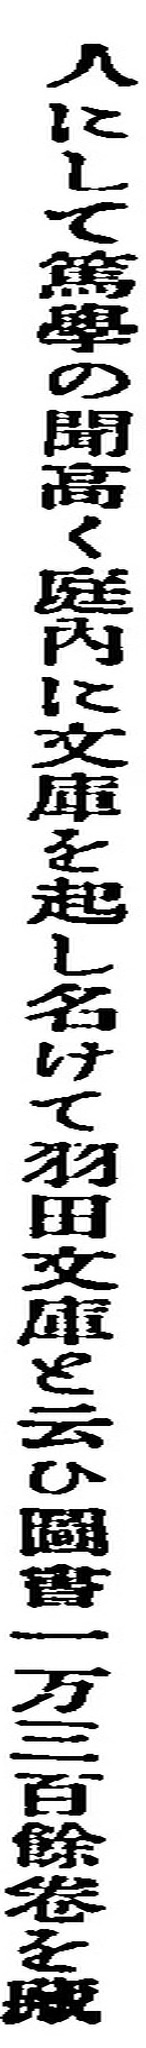人にして篤學の聞高く庭内に文庫を起し名けて羽田文庫と云ひ圖書一万三百餘卷を藏
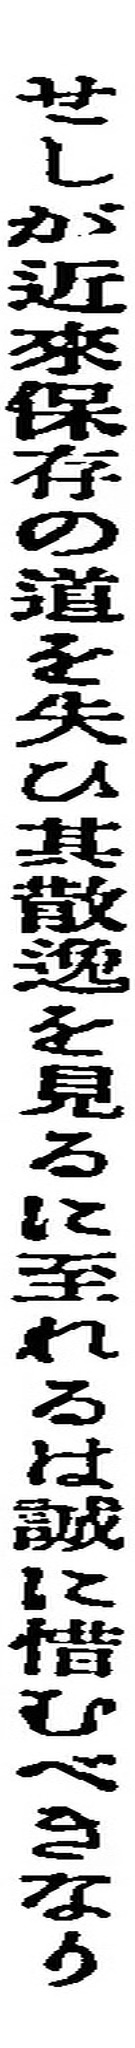せしが近來保存の道を失ひ其散逸を見るに至れるは誠に惜むべきなり
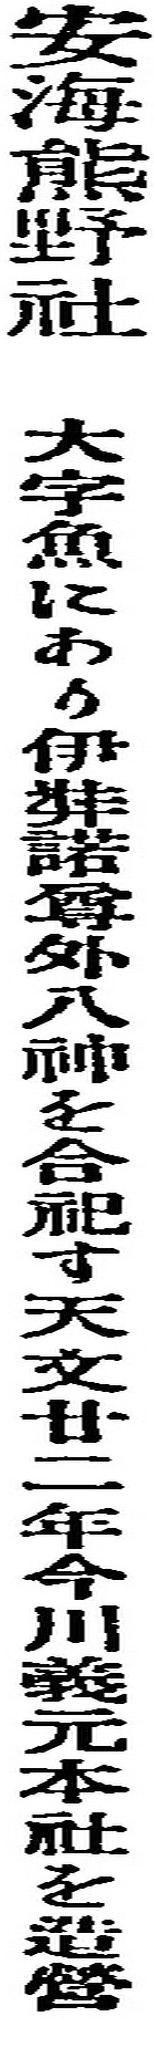安海熊野社大字魚にあり伊弉諾尊外八神を合祀す天文廿二年今川義元本社を造營
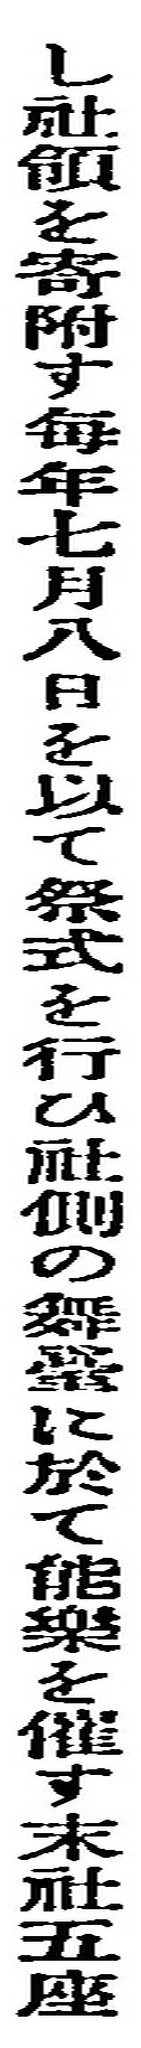し社領を寄附す每年七月八日を以て祭式を行ひ社側の舞臺に於て能樂を催す末社五座
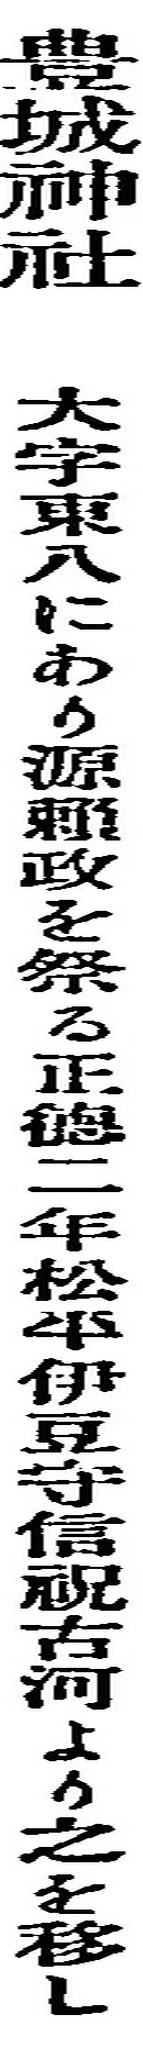豊城神社大字東八にあり源賴政を祭る正德二年松平伊豆守信祝古河より之を移し
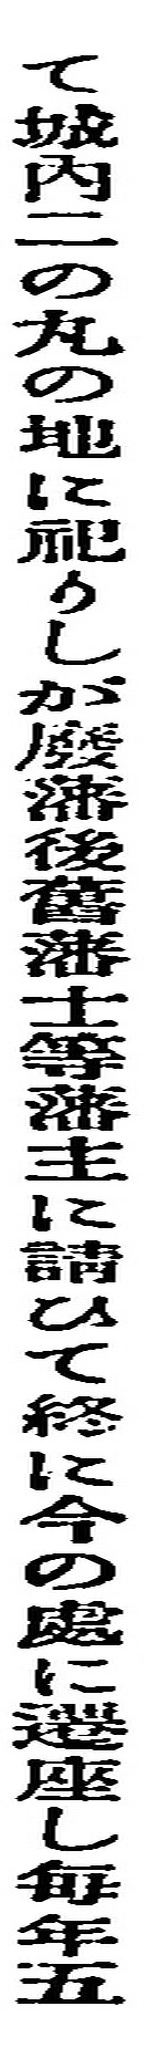て城内二の丸の地に祀りしが廢藩後舊藩士等藩主に請ひて終に今の處に遷座し每年五
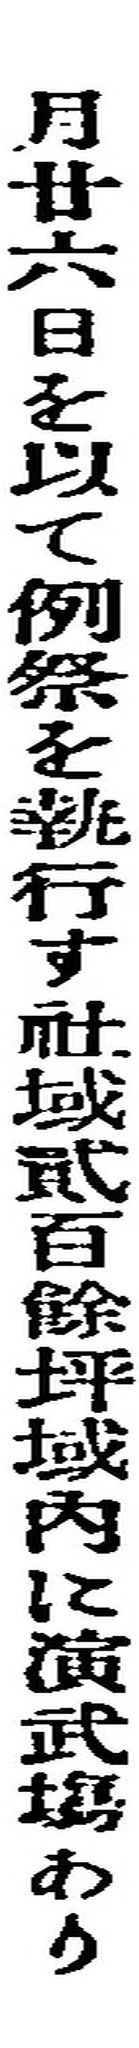月廿六日を以て例祭を執行す社域貳百餘坪域内に演武場あり
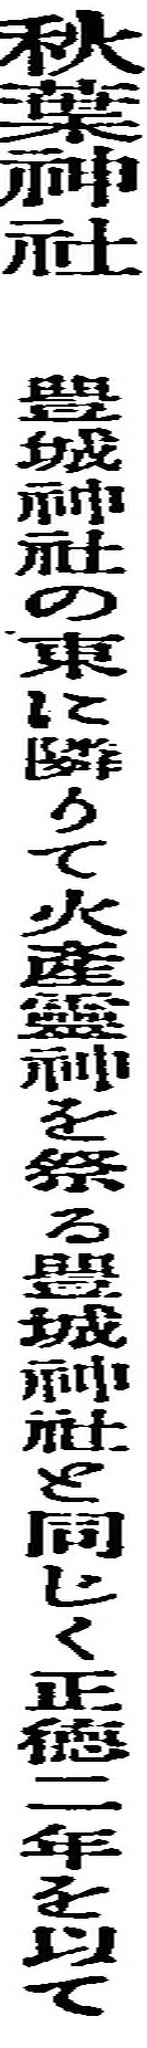秋葉神社豊城神社の東に隣りて火產靈神を祭る豊城神社と同じく正德二年を以て
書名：豊橋志要
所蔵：国立国会図書館 National Diet Library, JAPAN
